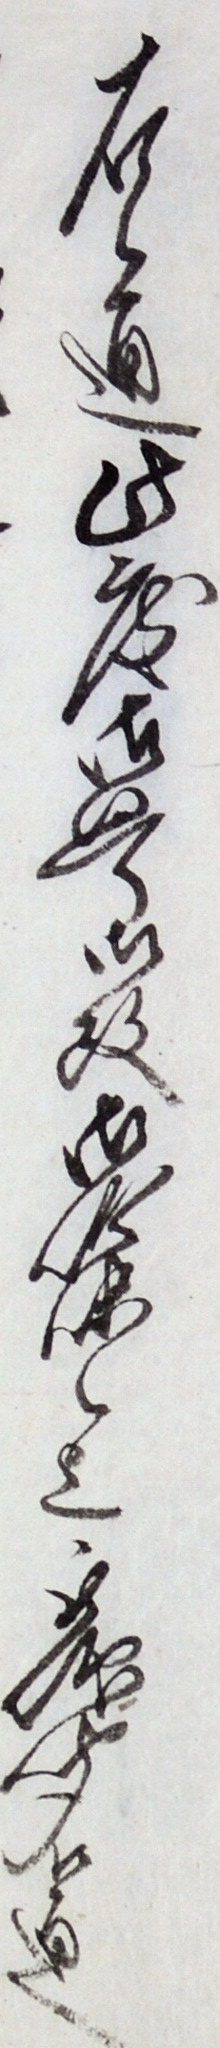右之通此度御廻り御改御吟味之上被仰聞候通
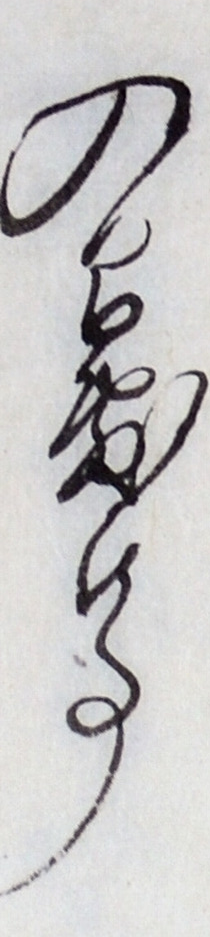仕間敷候事
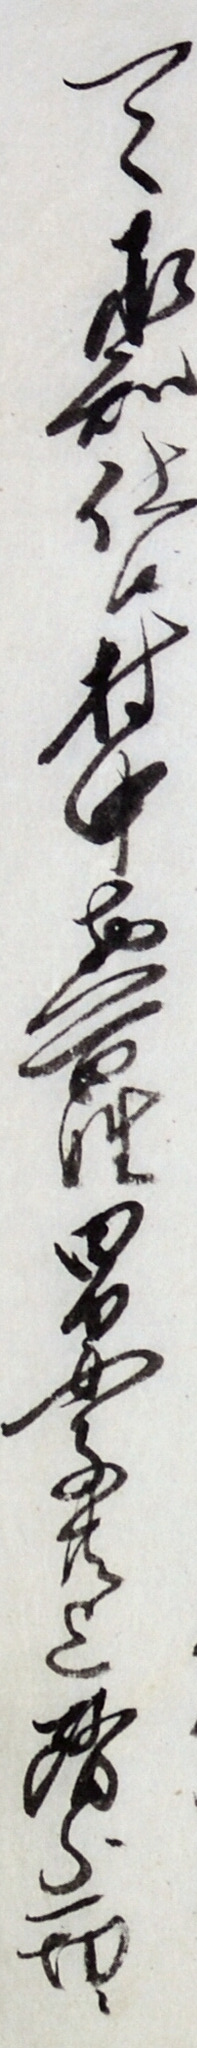一々承知仕候村中惣百姓男女子共迄随分一切ニ

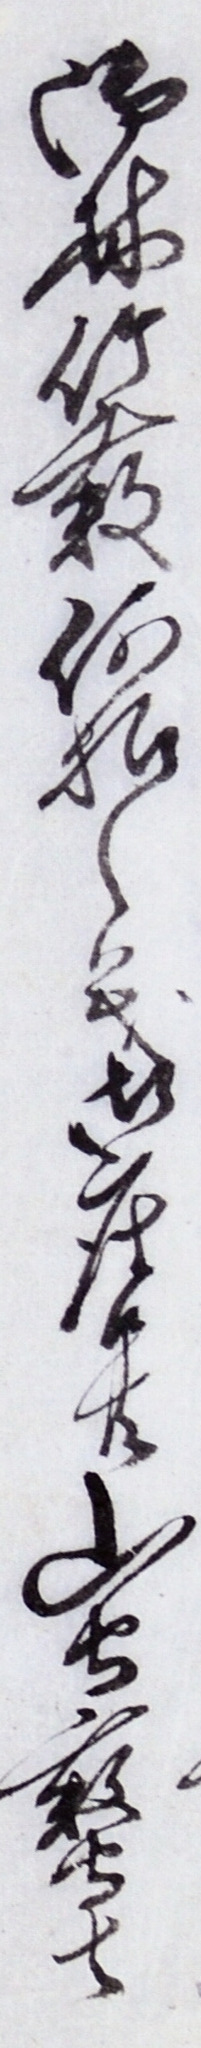御林竹薮何様之義御座候共山守薮守者
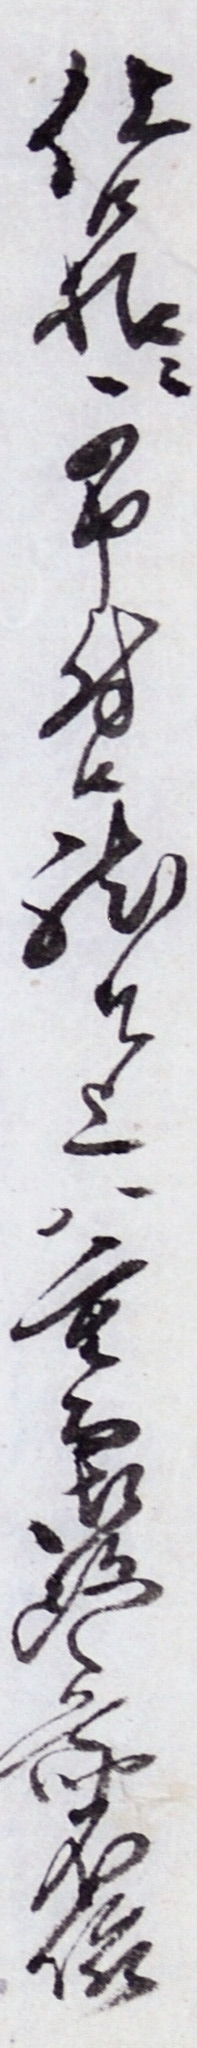仕候様ニ可申付候然ル上ハ重而御改之節不依
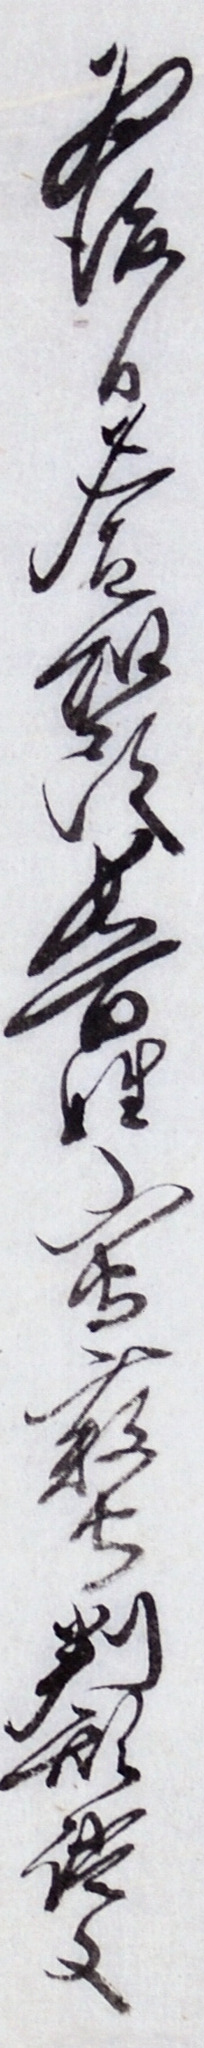為後日名主組頭長百姓山守薮守判形証文
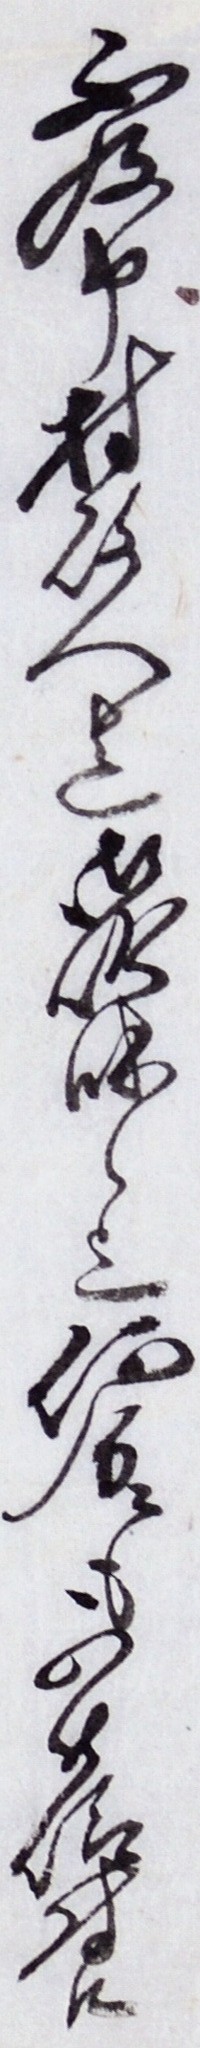不及申村役人迄御吟味之上何分ニも可被仰付候
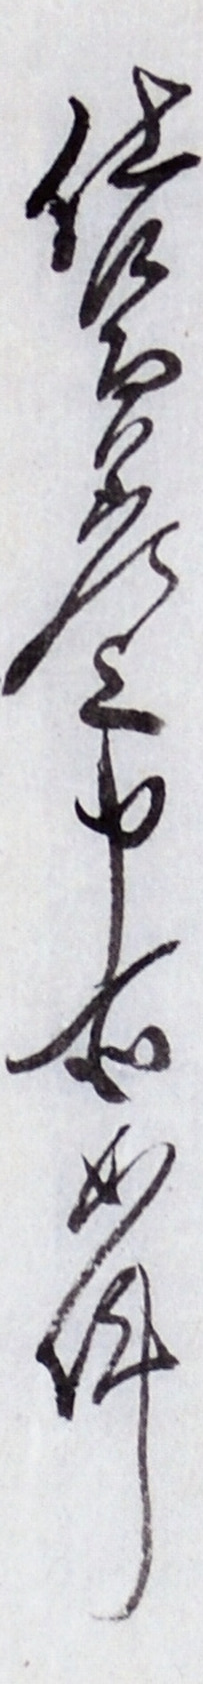仕候而差上申所如件
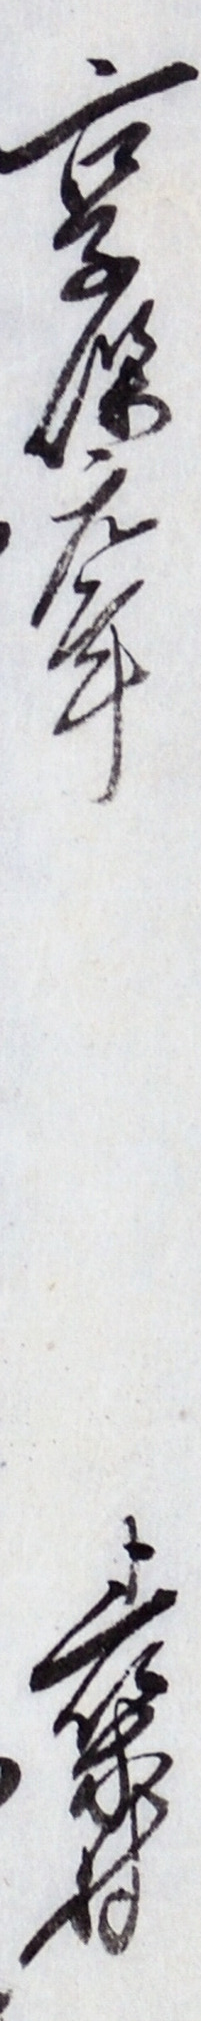享保元年表木村
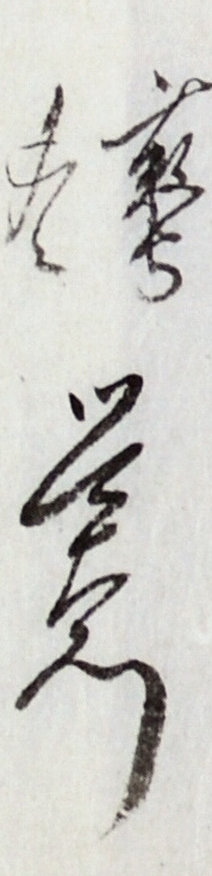薮守右衛門

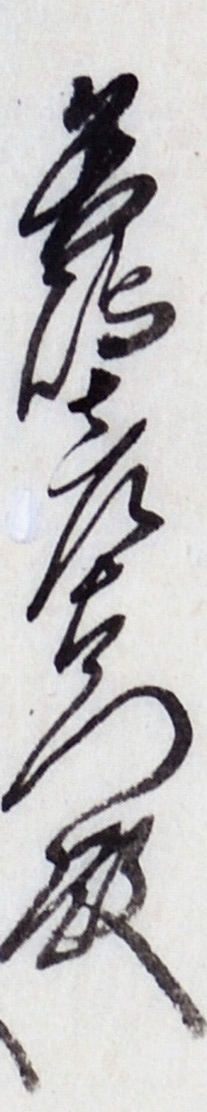矢嶋彦右衛門殿
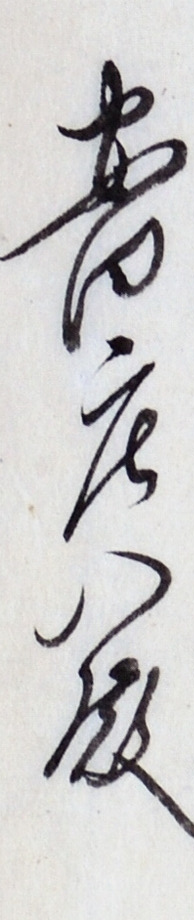安田庄八殿
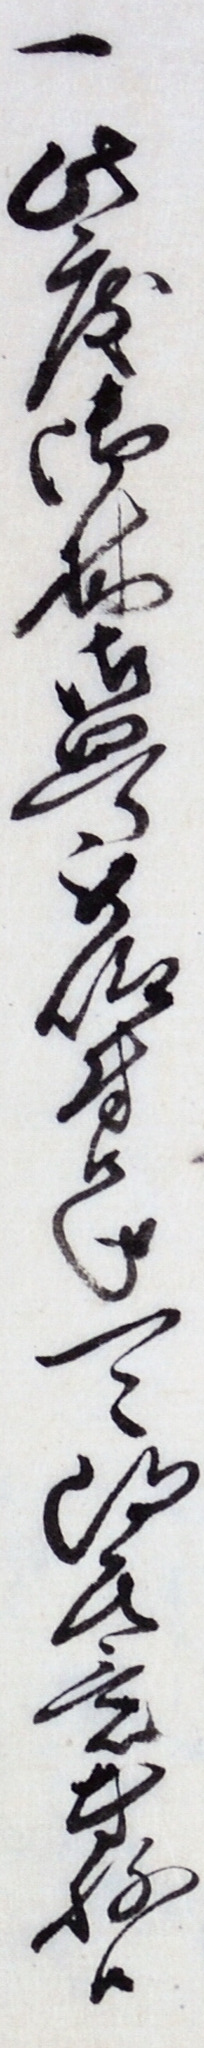一此度御林御廻り被付候趣一々得其意奉存候
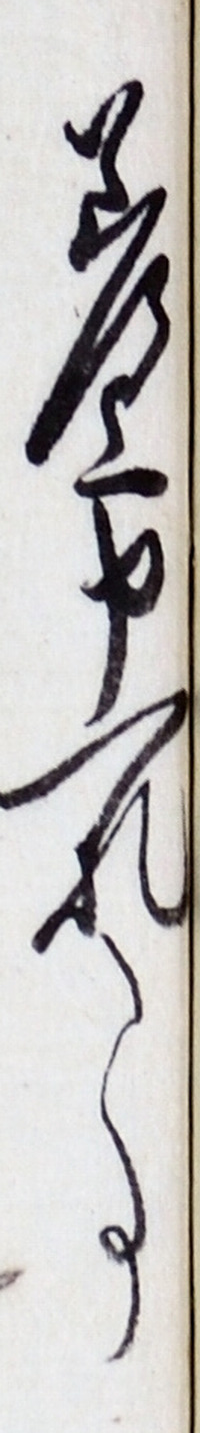差上申一札之事
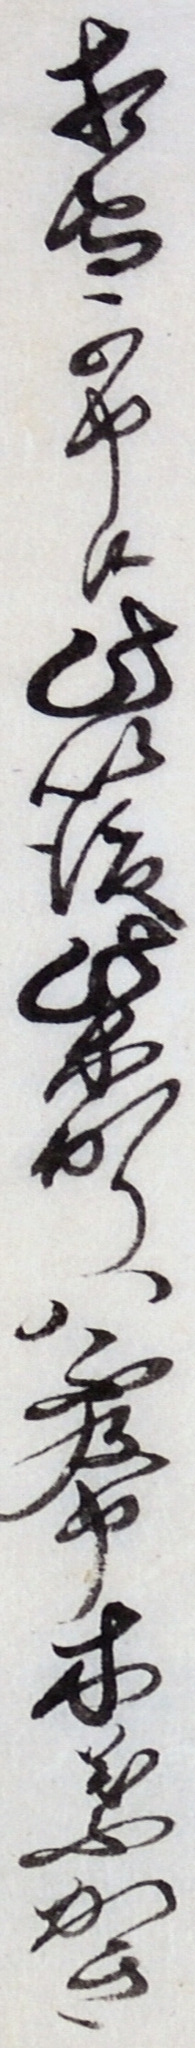相守可申候此以後柴かりハ不及申木葉かき
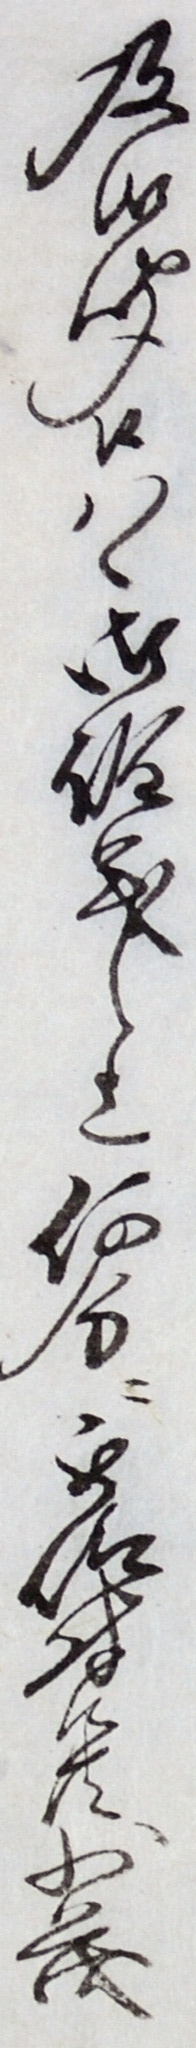及候聞候ハヽ御詮義之上何分ニ被仰付候共少も
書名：御林御竹藪証文控
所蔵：伊那市立高遠町図書館・合同会社AMANE
